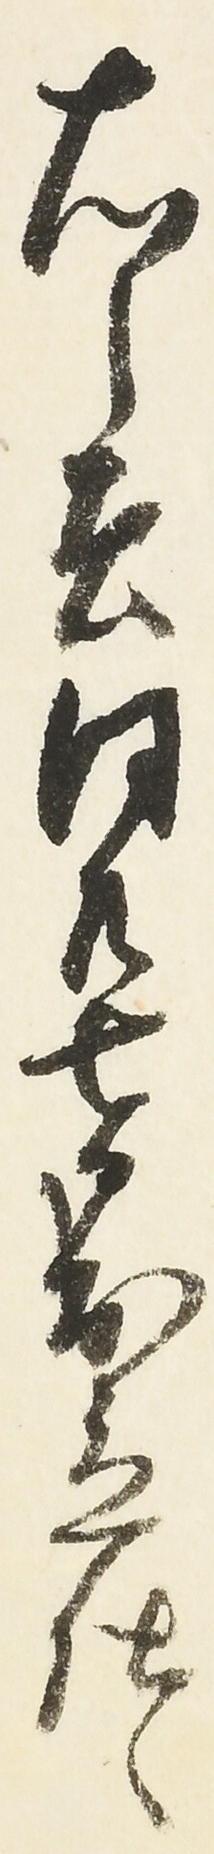右之者同廿七日出立仕候

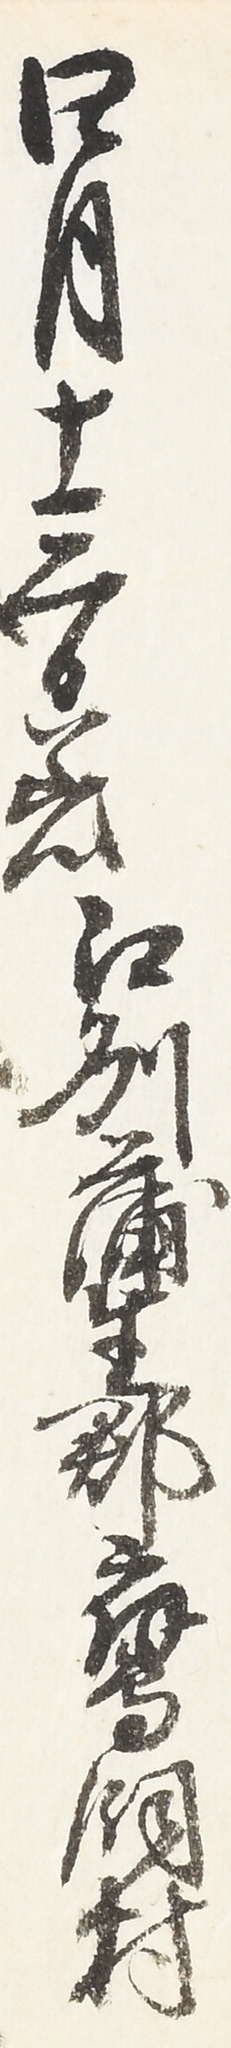四月十三日着江州蒲生郡鷹飼村
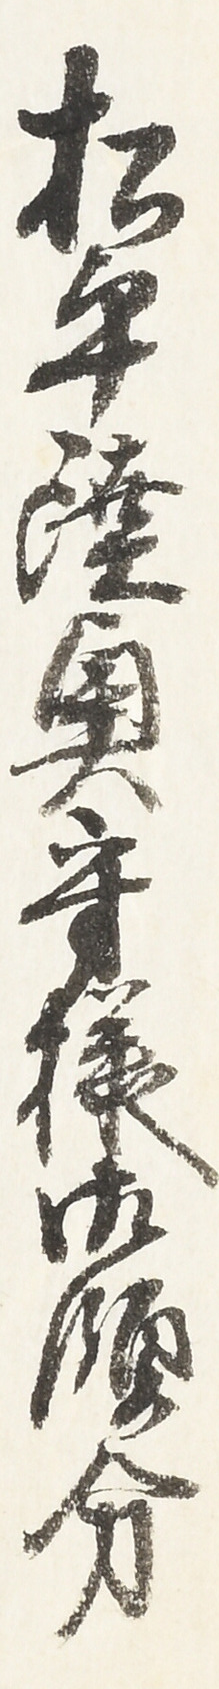松平陸奥守様御領分
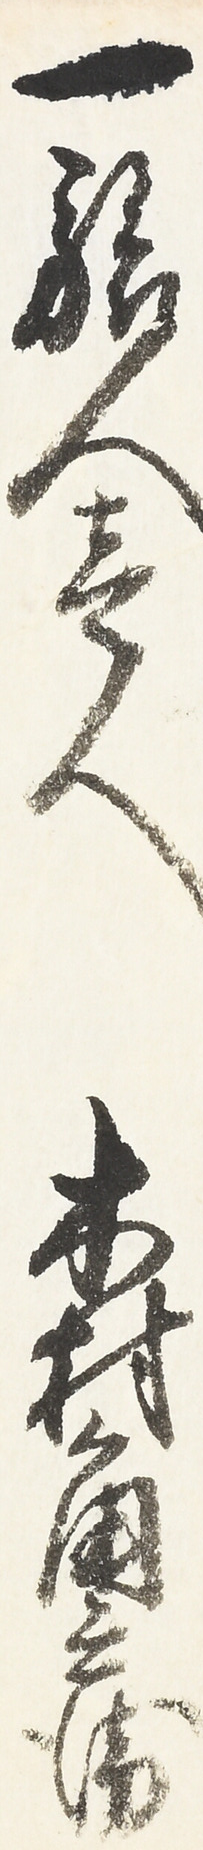一旅人壱人木村角兵衛
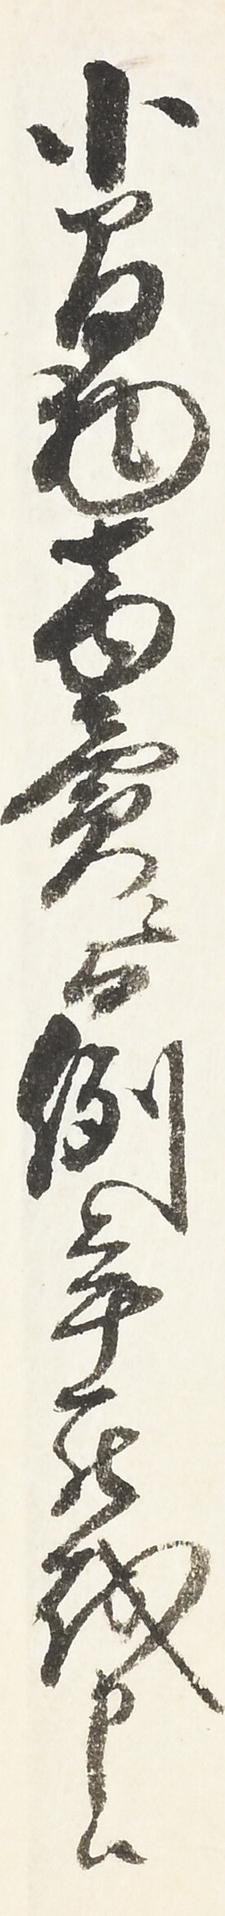小間物商売ニ而例年罷越申候
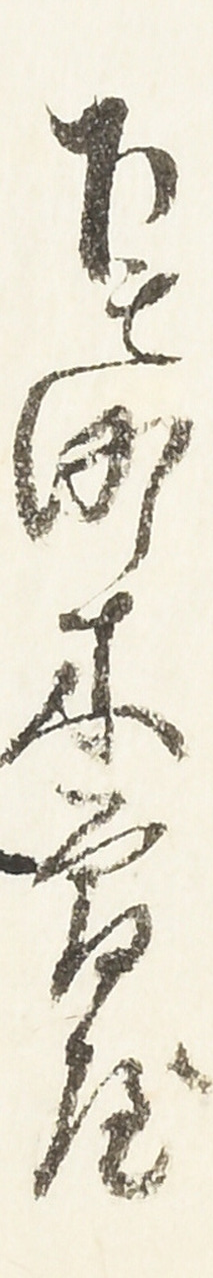下モ町木曽屋
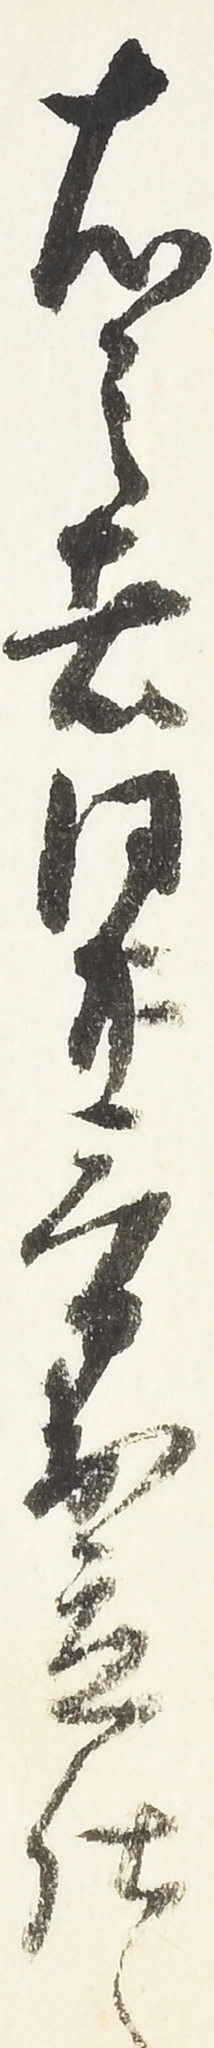右之者同廿三日出立仕候
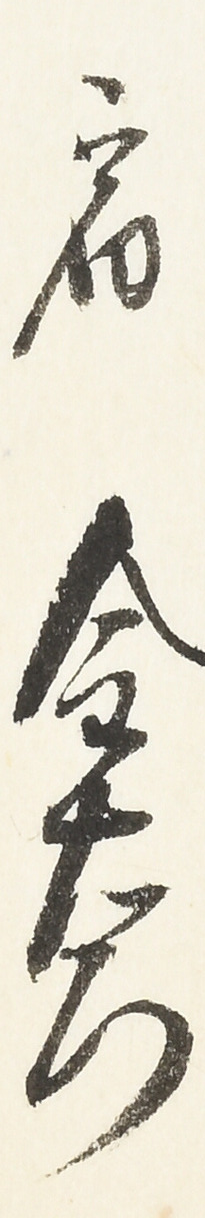宿金右衛門
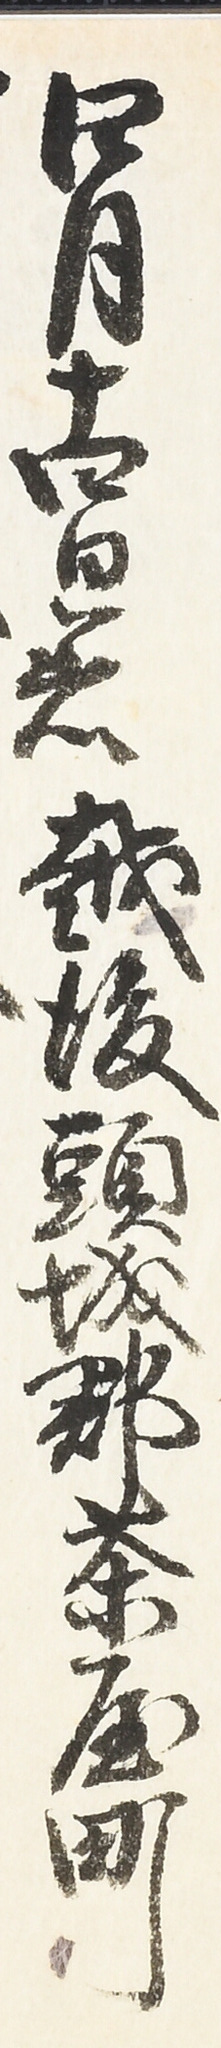四月十四日着越後頸城郡茶屋町
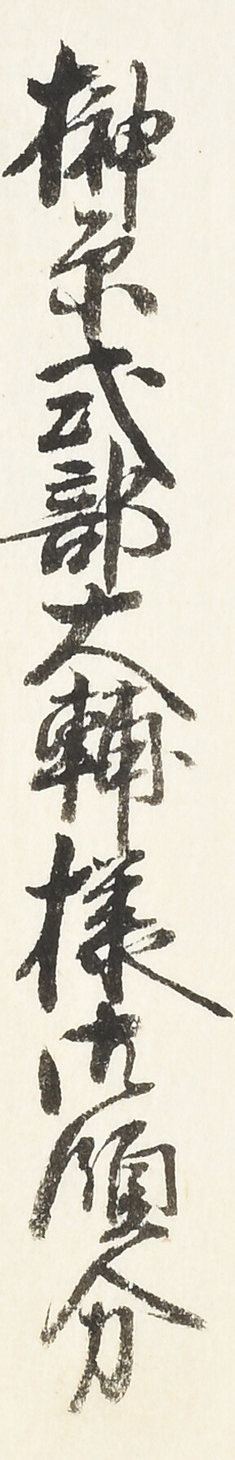榊原式部大輔様御領分
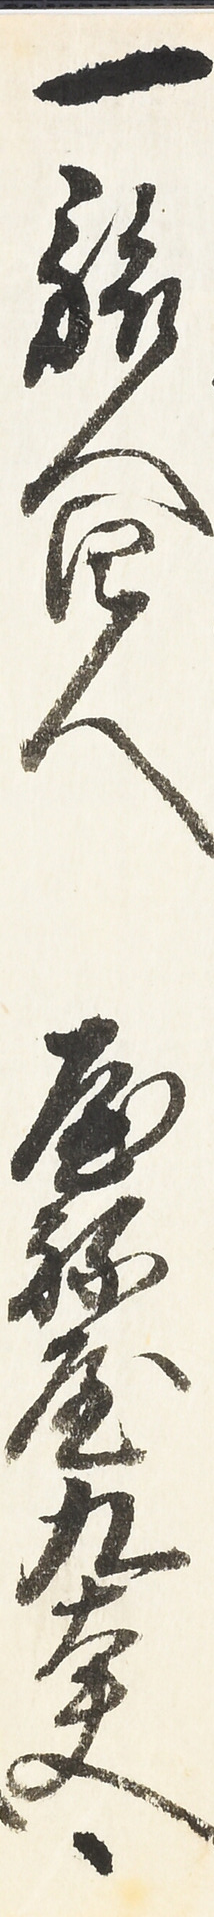一旅人四人屋祢屋九大夫・
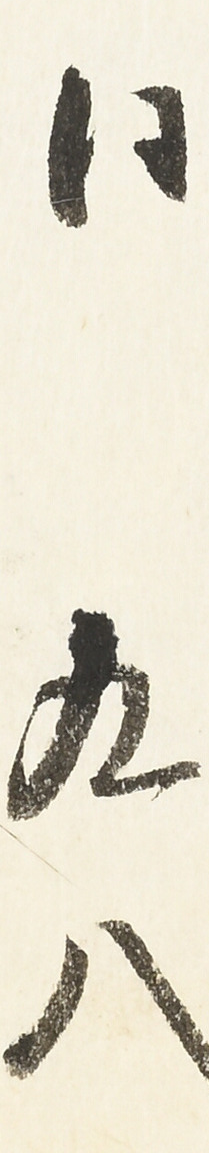同九八
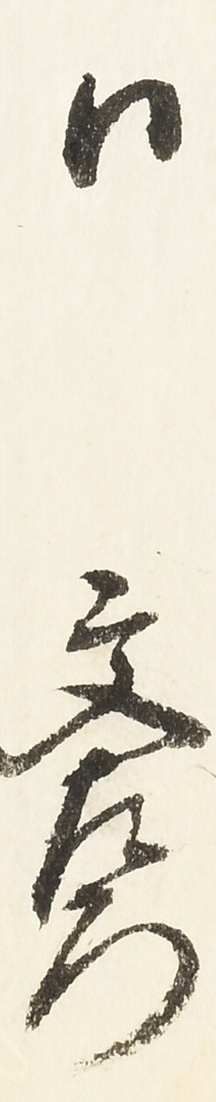同文左衛門
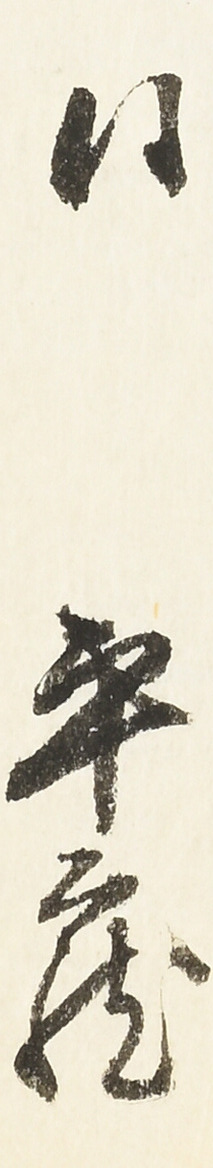同平蔵
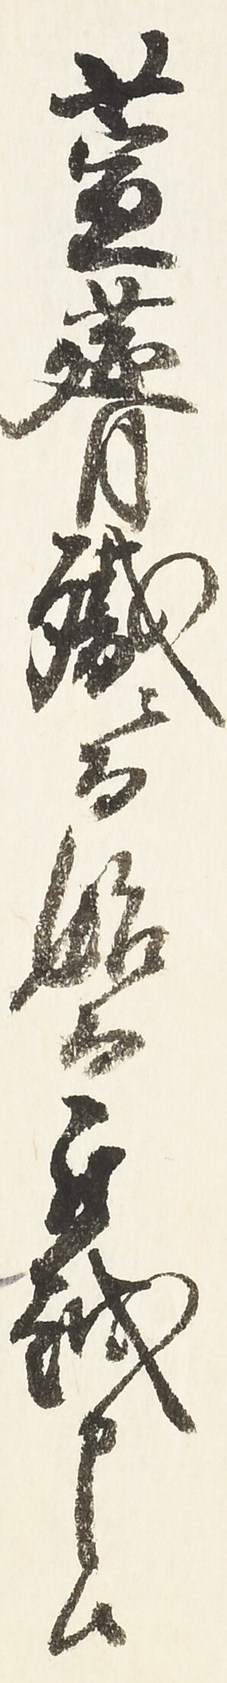萱葺職ニ而始而罷越申候
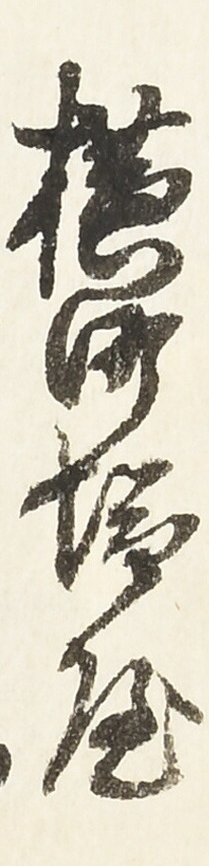横町塩屋
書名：町中旅人泊控帳
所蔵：伊那市立高遠町図書館・合同会社AMANE
